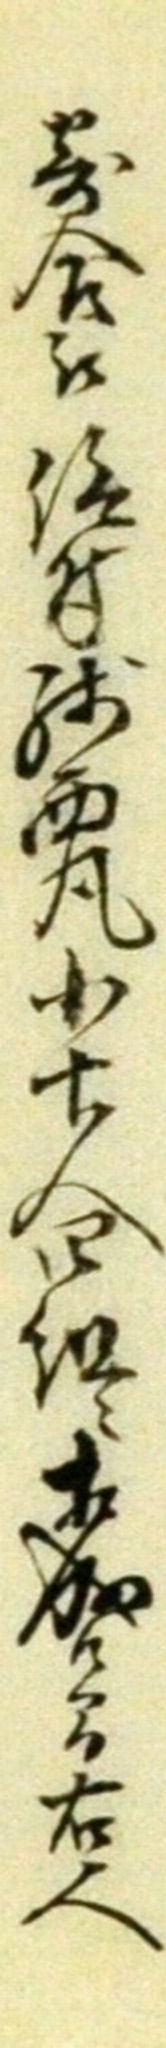寄合被仰付残西丸小十人四組ニ相成候間右人
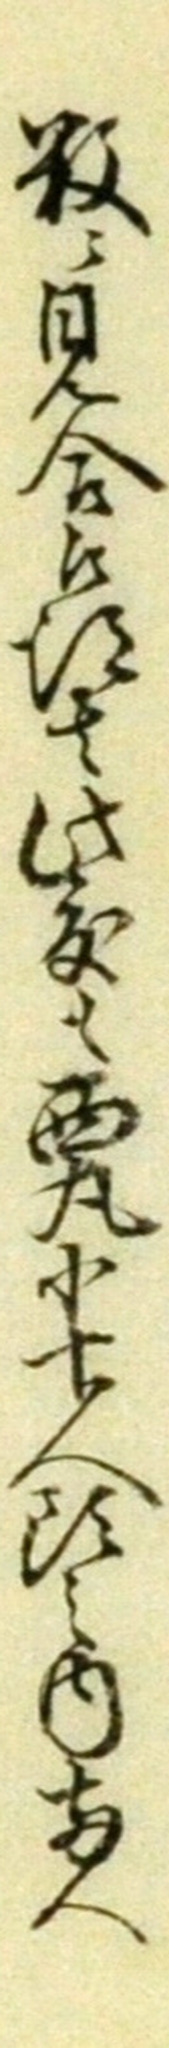数ニ見合候得者此度者西丸小十人頭之内両人
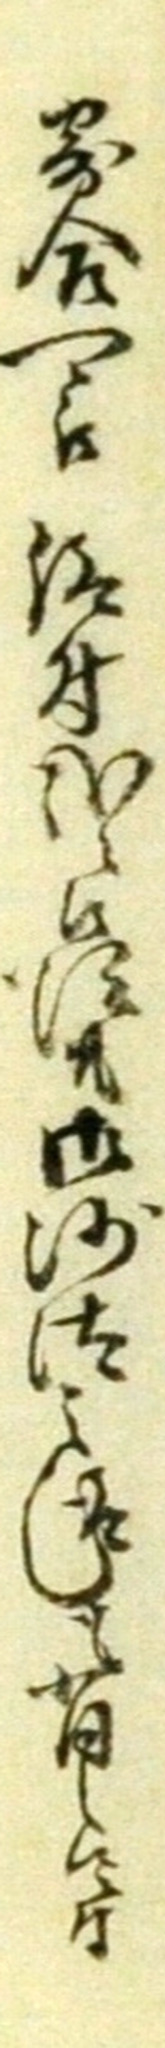寄合可被仰付哉ニ候得共御沙汰之趣も有之候ニ付
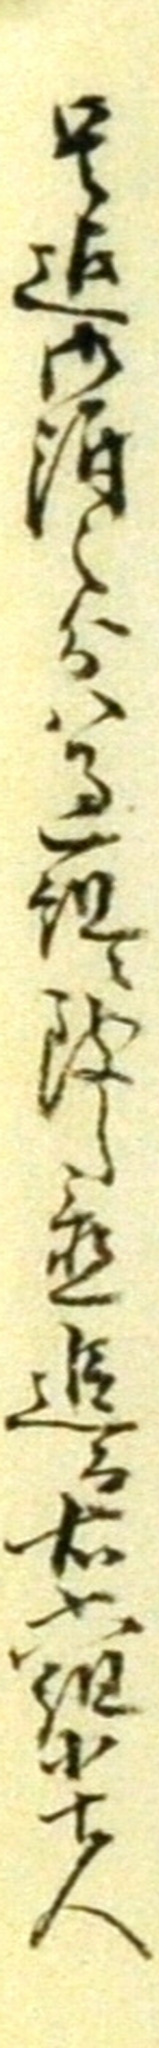是迄御附之分ハ過組ニ致置追而右六人小十人

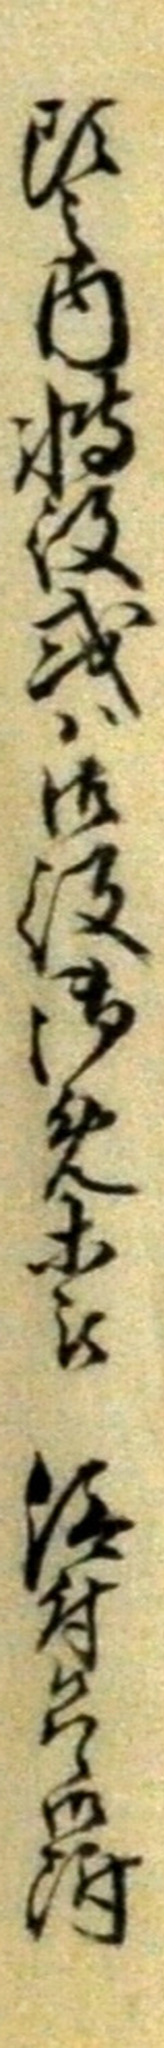頭之内轉役或ハ御役御免等被仰付候ハゝ御附
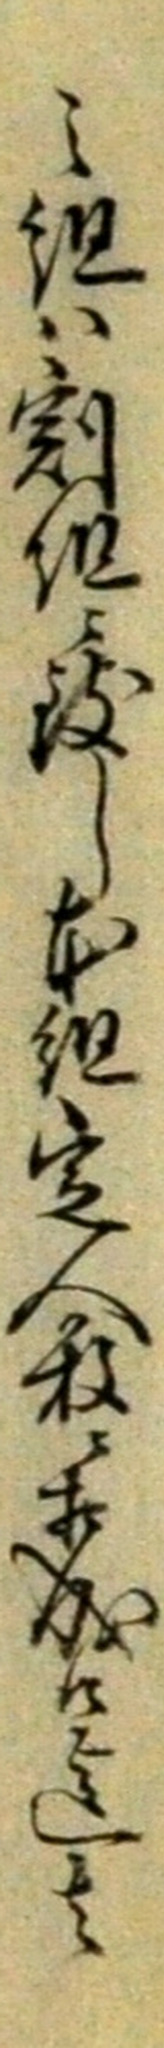之組ハ割組ニ致し本組定人数ニ相成候迄者
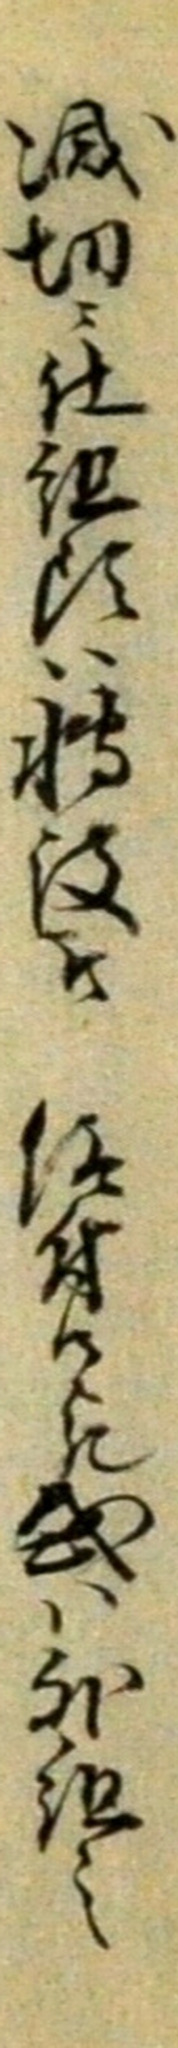滅切ニ仕組頭ハ轉役被仰付候歟或ハ外組之
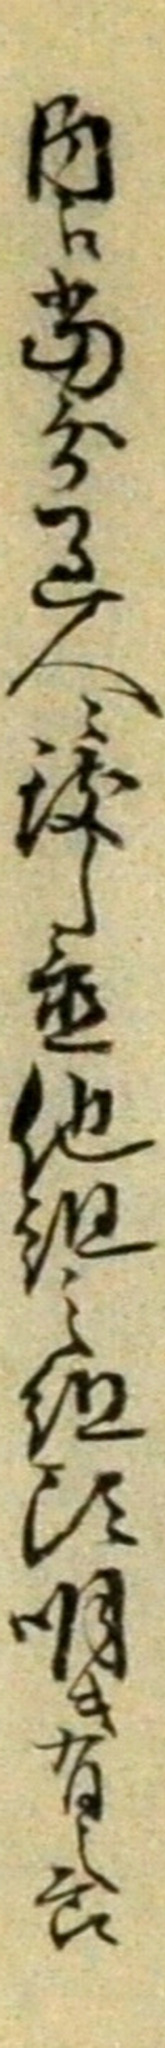内江当分過人ニ致し置他組之組頭明キ有之節
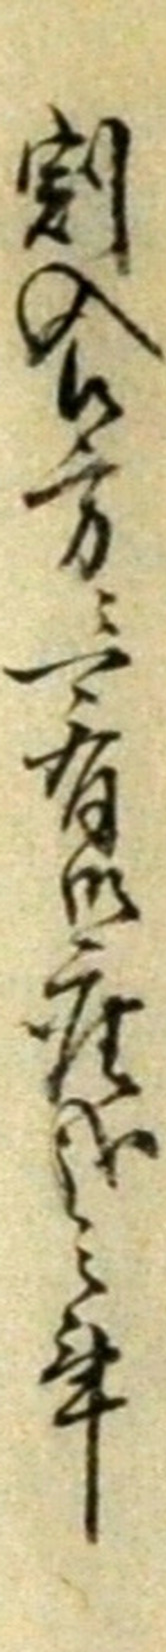割入候方ニ可有御座哉之事
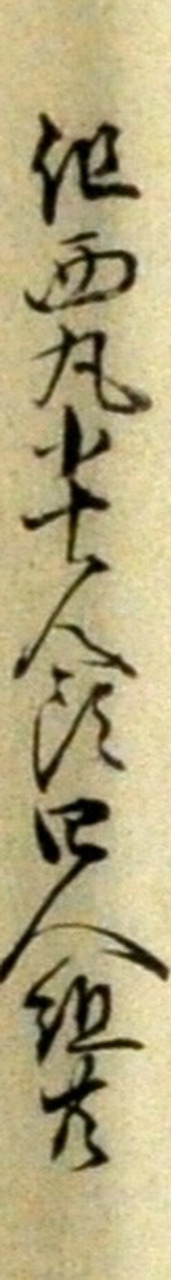但西丸小十人頭四人組共
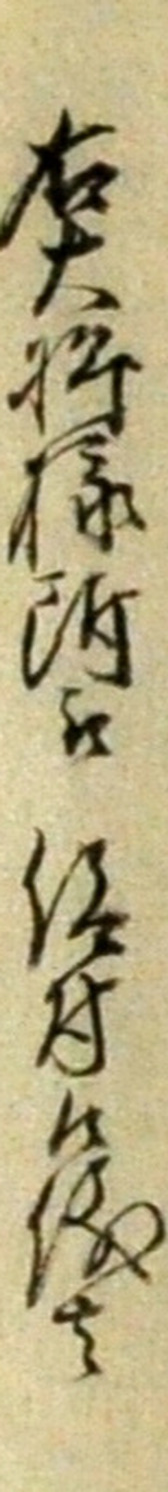右大将様附被仰付候儀者
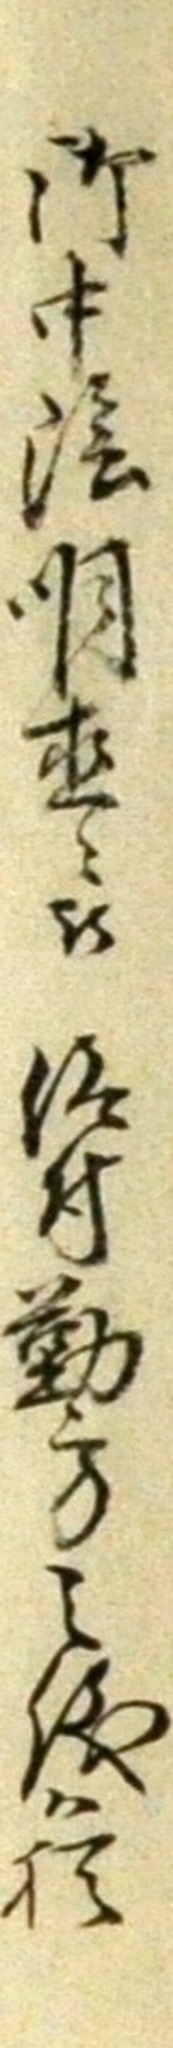御中陰明直ニ被仰付勤方之儀ハ猶
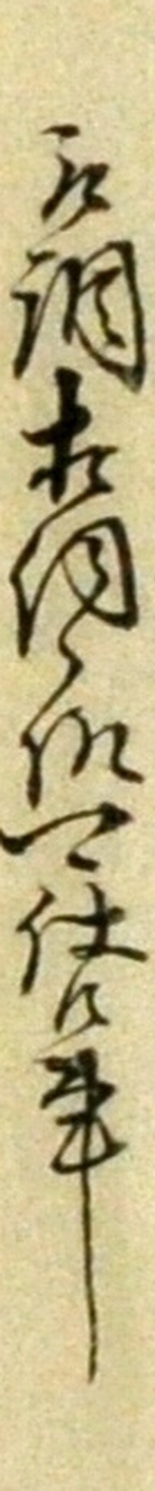取調相伺候様可仕候事
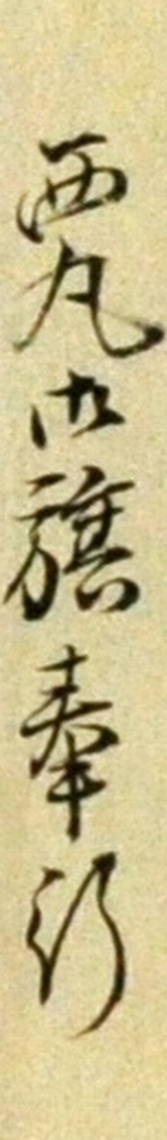西丸御旗奉行
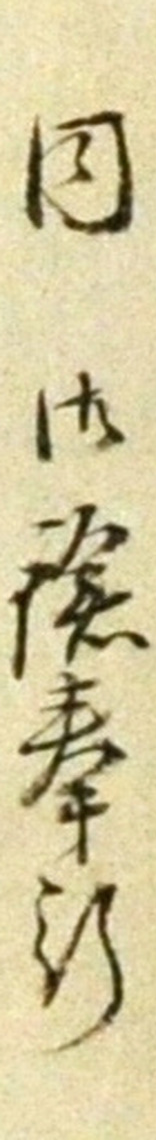同御鎗奉行
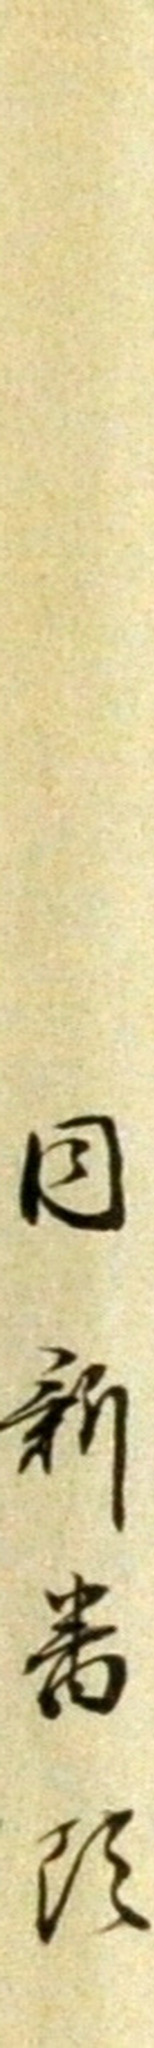同新番頭
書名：若年寄御役中御調書付
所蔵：伊那市立高遠町図書館・合同会社AMANE
